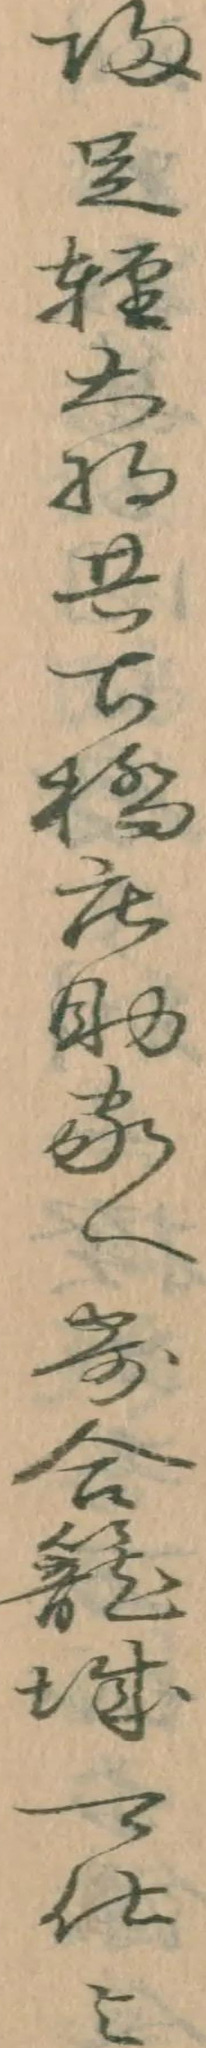帰足軽大将共古橋庄助家へ寄合籠城可仕与
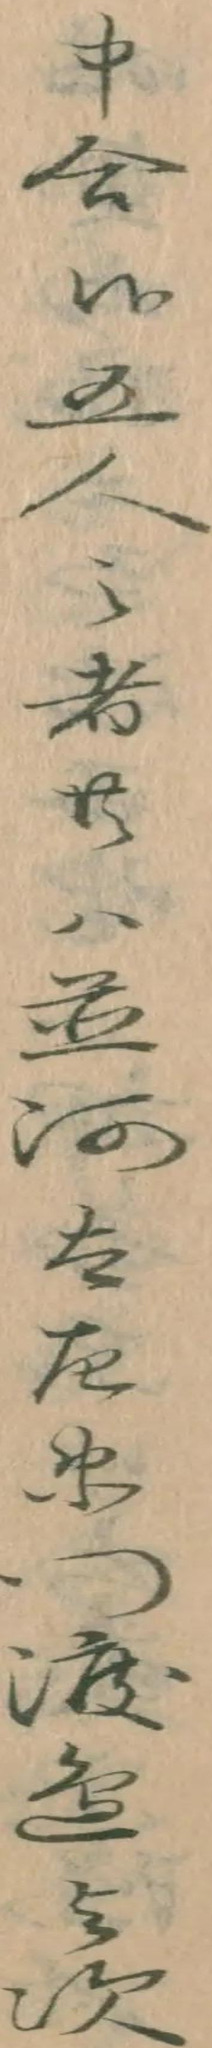申合候五人之者共は並河太左衛門渡辺与次
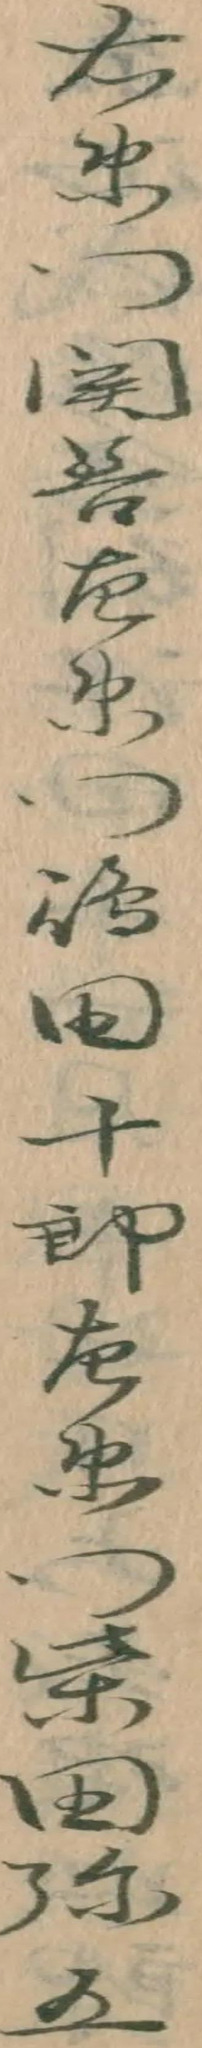右衛門関善左衛門島田十郎左衛門柴田弥五
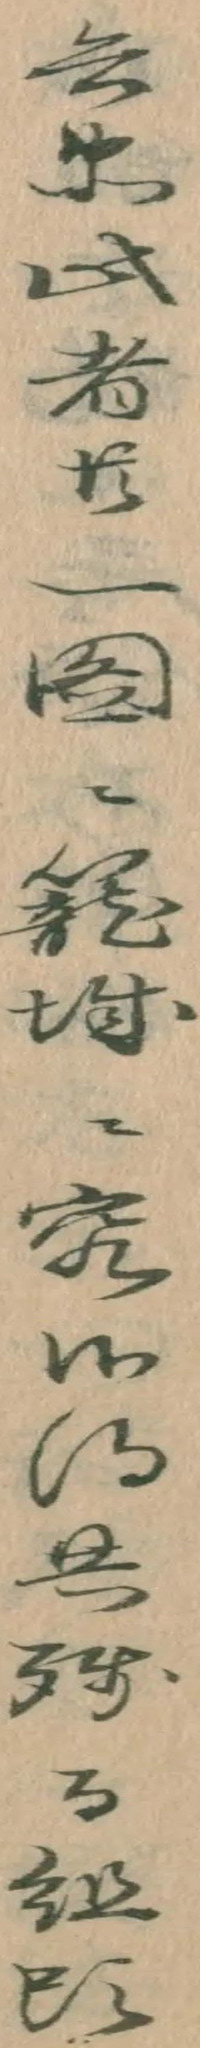兵衛此者共一円に籠城に究候得共残る組頭
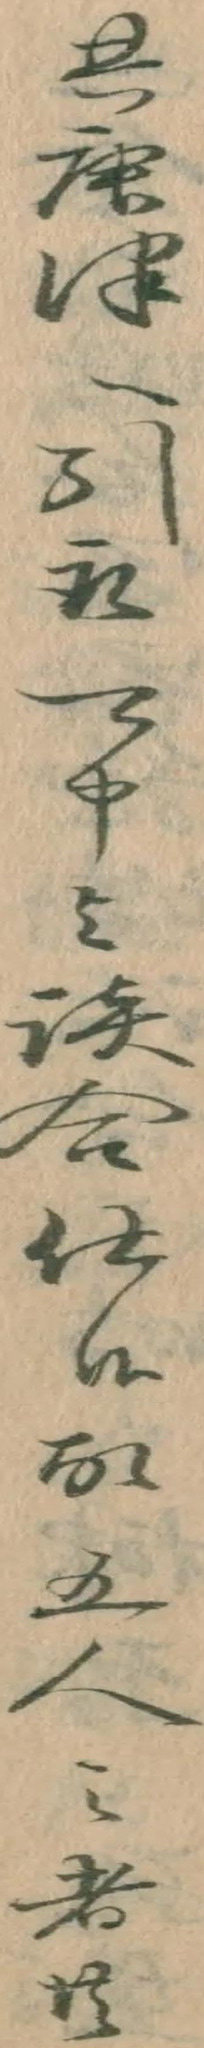共唐津へ引取可申与談合仕候故五人之者共
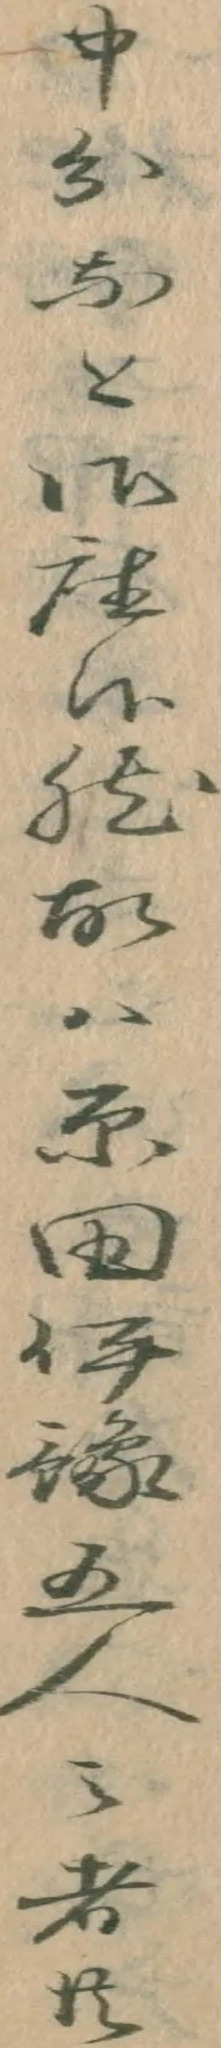申分なと御座候然故は原田伊予五人之者共
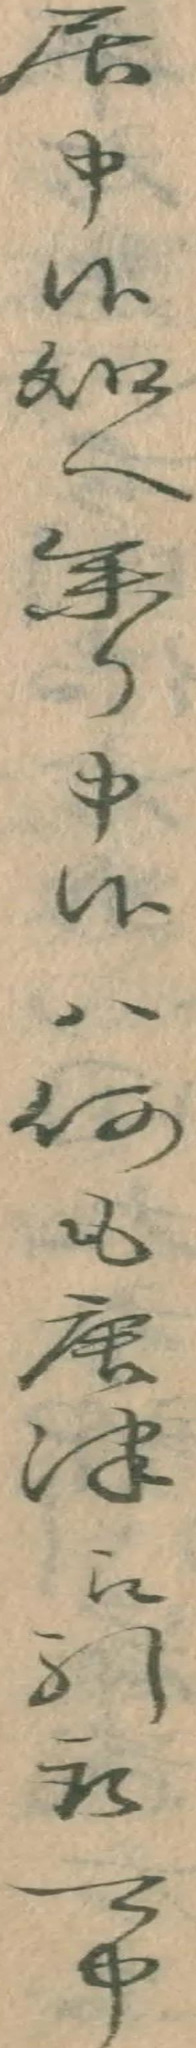居申候処へ参り申候は何も唐津江引取可申
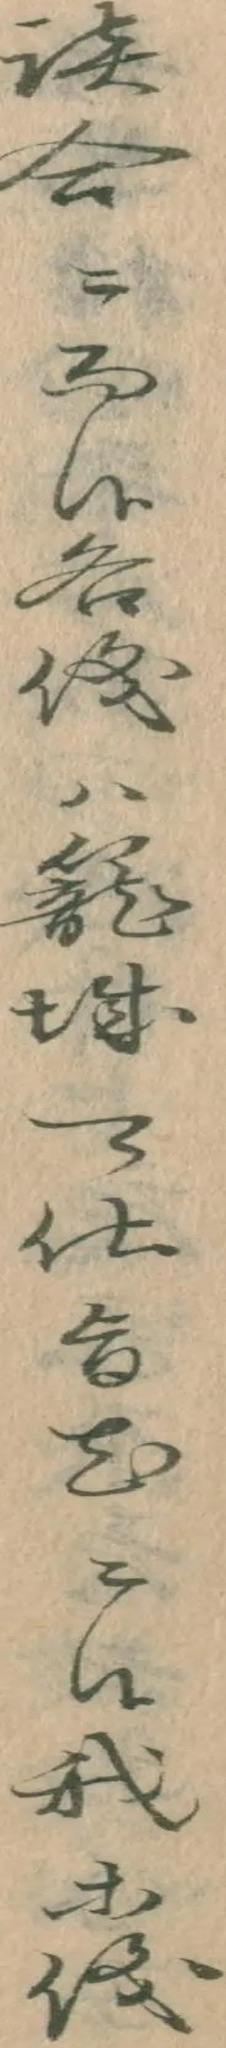談合に而候各儀は籠城可仕旨尤に候我等儀
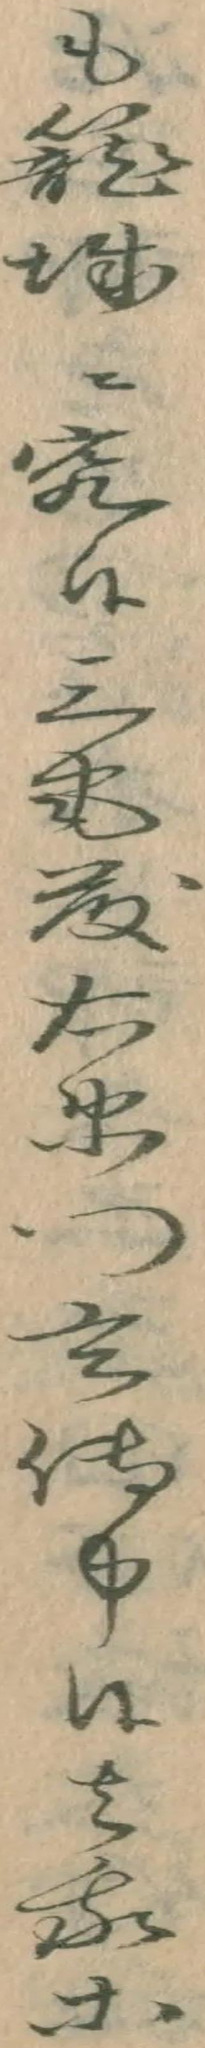も籠城に究候三宅藤右衛門言伝申候者我等
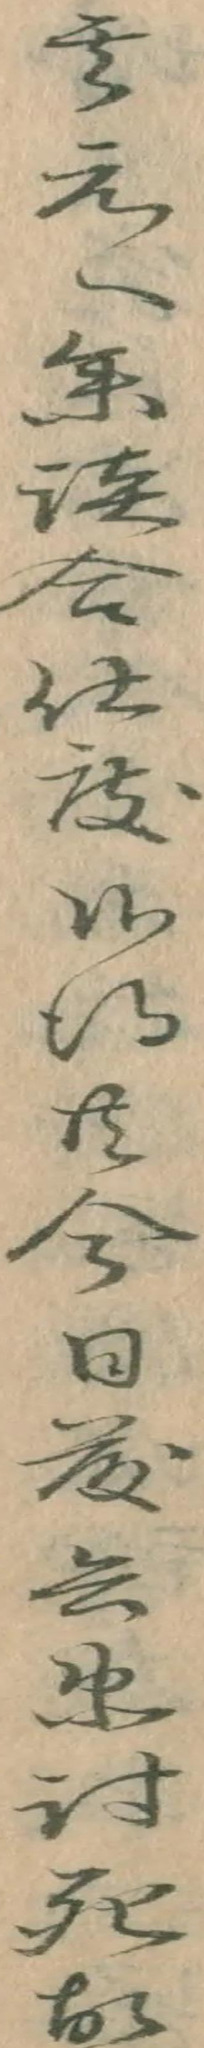其元へ参談合仕度候得共今日藤兵衛討死故
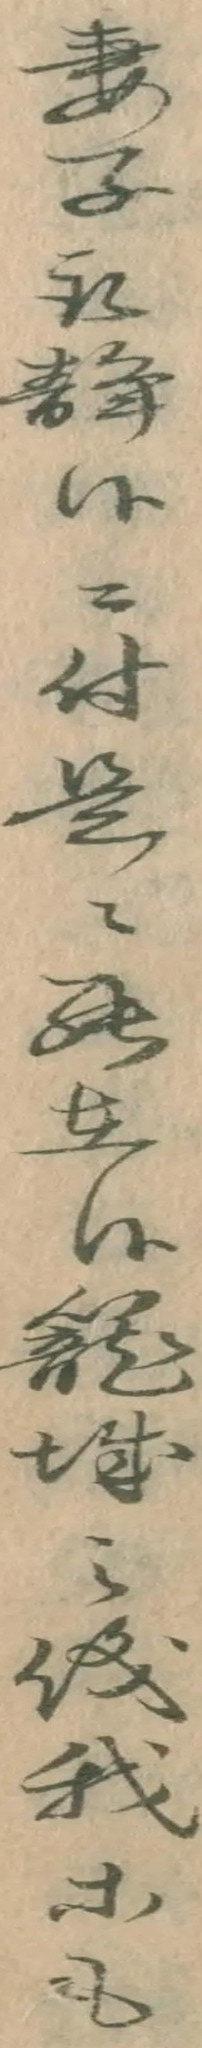妻子被静候に付是に罷在候籠城之儀我等も

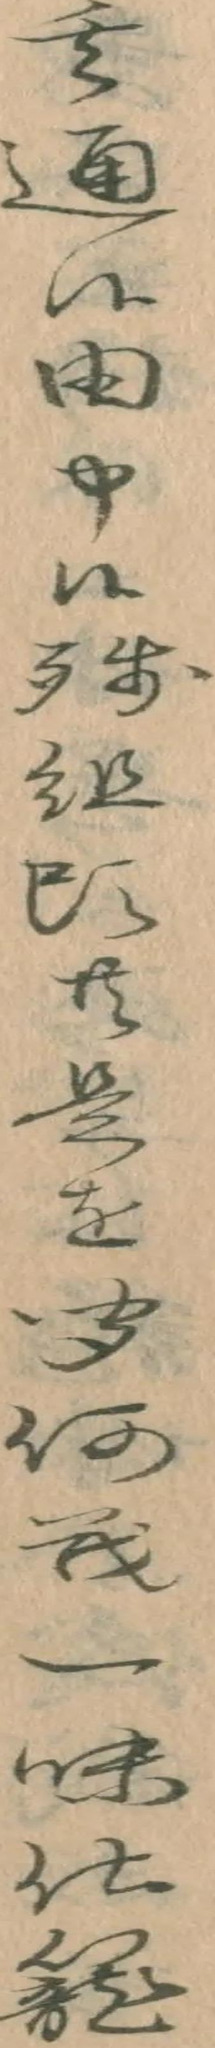其通候由申候残組頭共是を聞何茂一味仕籠
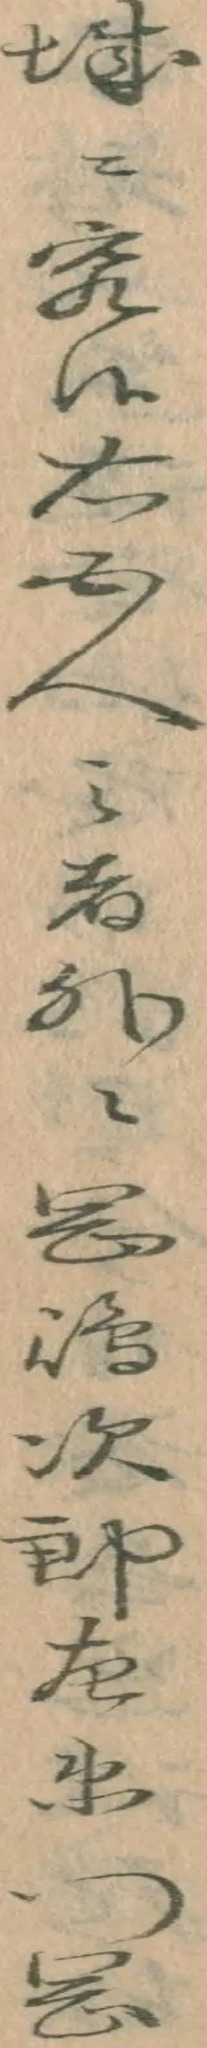城に究候右五人之者外に岡島次郎左衛門岡
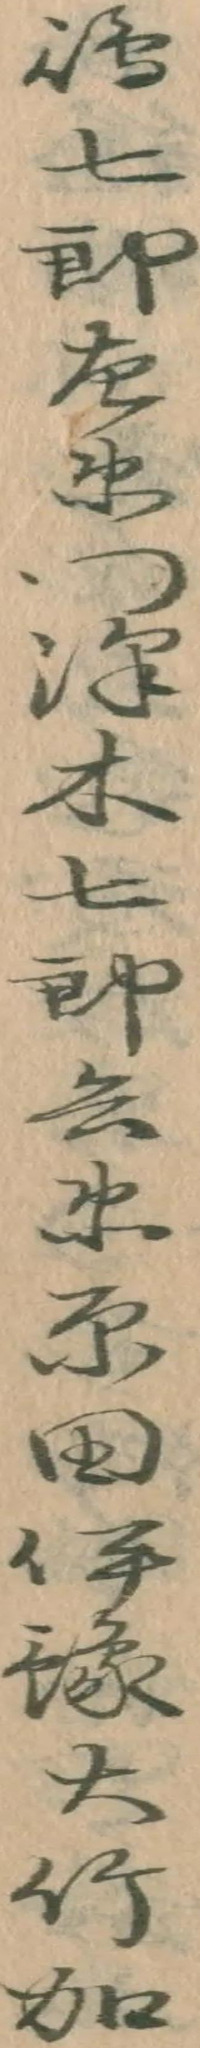島七郎左衛門沢木七郎兵衛原田伊予大竹加
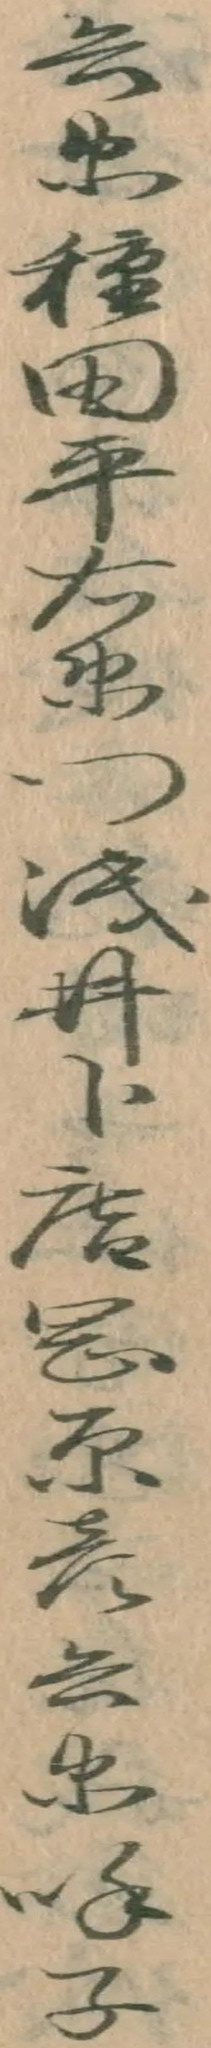兵衛種田平右衛門浅井ト広岡原彦兵衛呼子
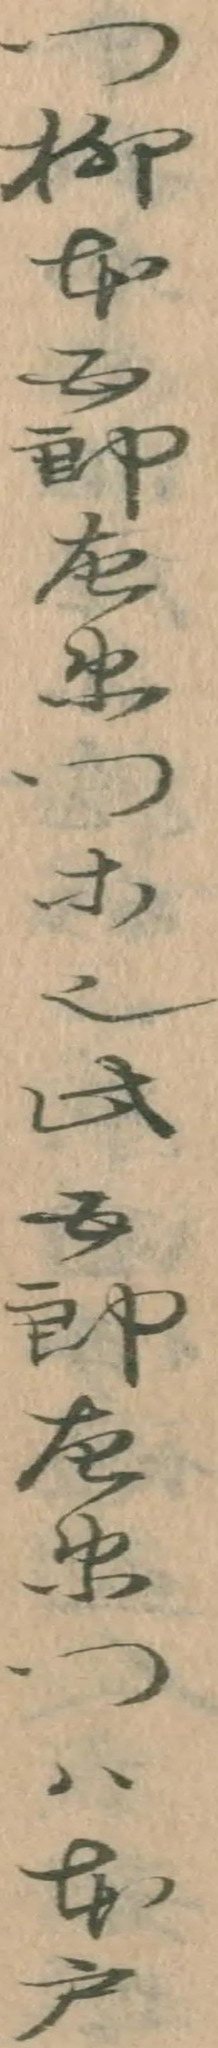門柳本五郎左衛門等也此五郎左衛門は本戸
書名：切支丹御退治記 49巻. [2]
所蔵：国立国会図書館 National Diet Library, JAPAN
